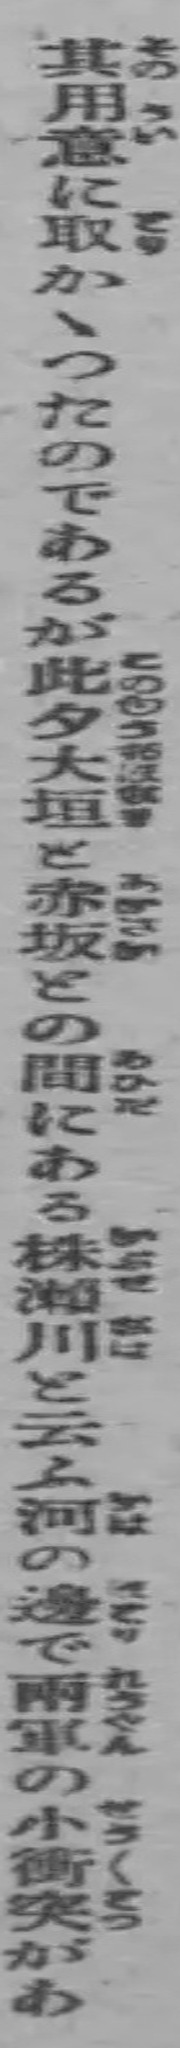株瀬川の戦其用意に取かゝつたのであるが此夕大垣と赤坂との間にある株瀬川と云ふ河の辺で両軍の小衝突があ
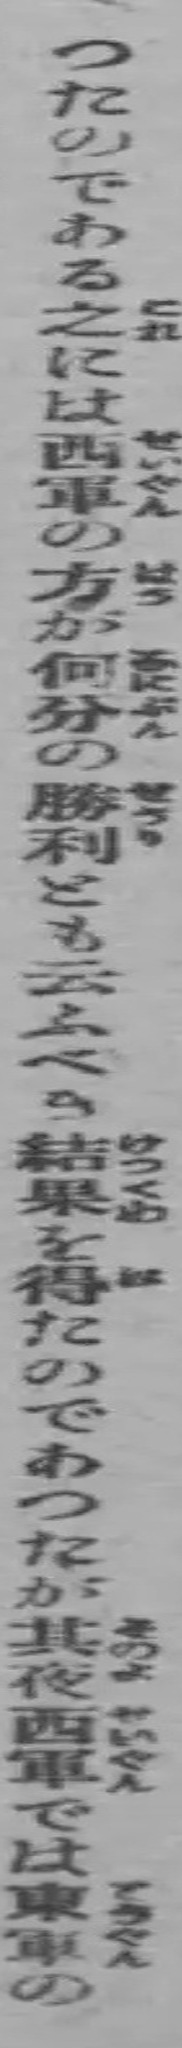つたのである之には西軍の方が何分の勝利とも云ふべき結果を得たのであつたが其夜西軍では東軍の
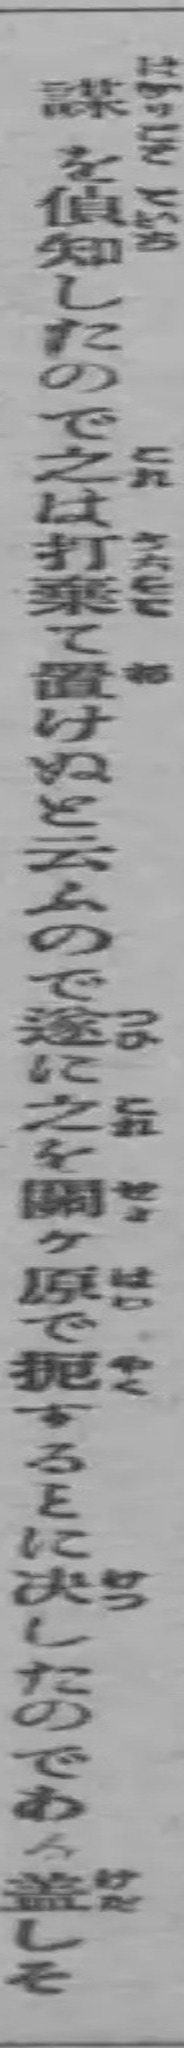謀を偵知したので之は打棄て置けぬと云ふので遂に之を関ケ原で扼することに決したのである蓋しそ
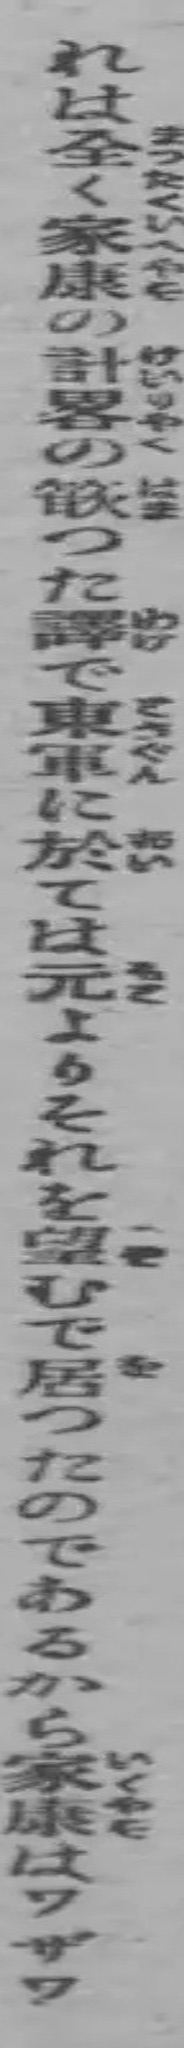れは全く家康の計略の嵌つた訳で東軍に於ては元よりそれを望むで居つたのであるから家康はワザワ
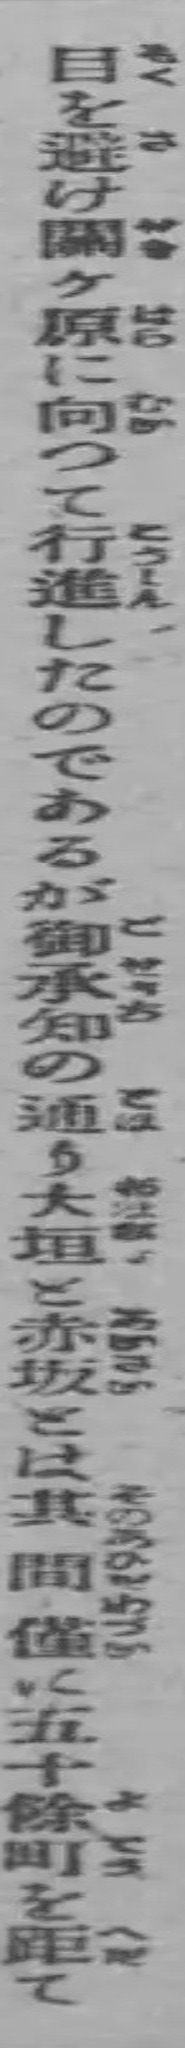目を避け関ヶ原に向つて行進したのであるが御承知の通り大垣と赤坂とは其間僅に五十余町を距て
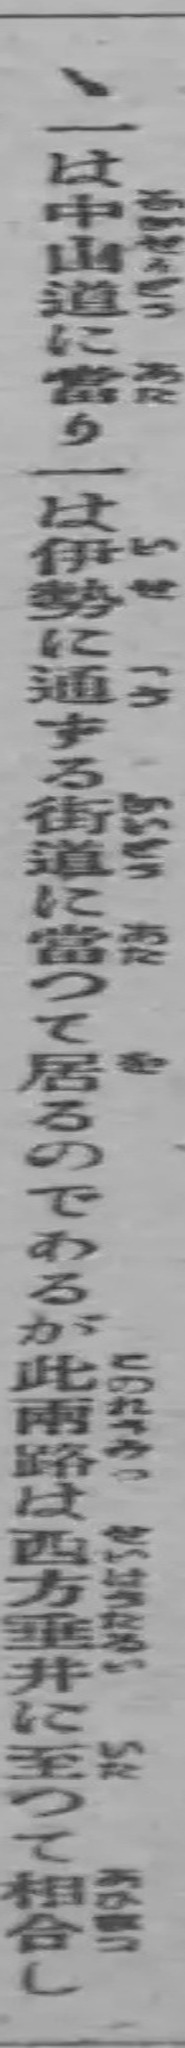ゝ一は中山道に当り一は伊勢に通ずる街道に当つて居るのであるが此両路は西方垂井に至つて相合し
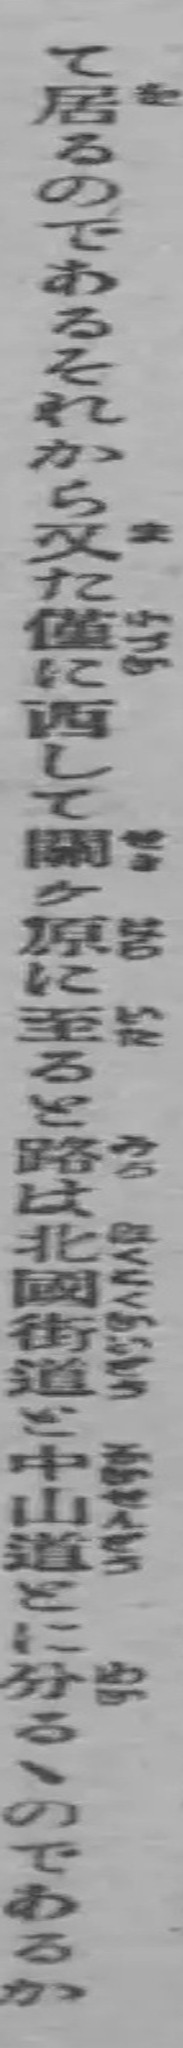て居るのであるそれから又た僅に西して関ヶ原に至ると路は北国街道と中山道とに分るゝのであるか
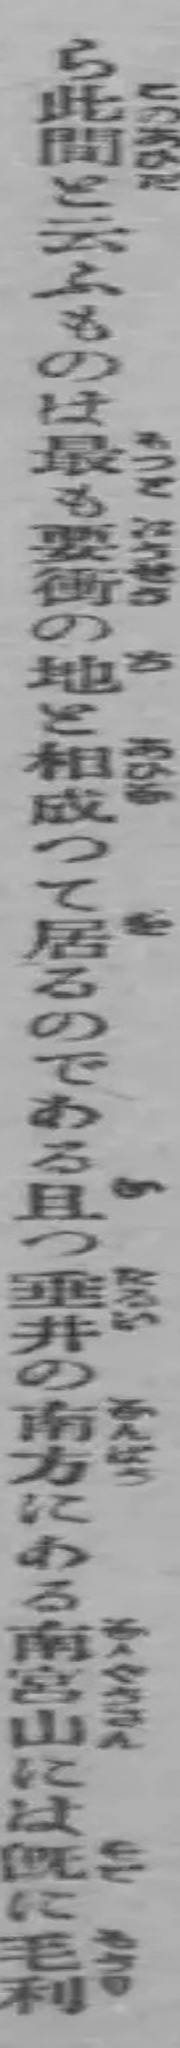ら此間と云ふものは最も要衝の地と相成つて居るのである且つ垂井の南方にある南宮山には既に毛利
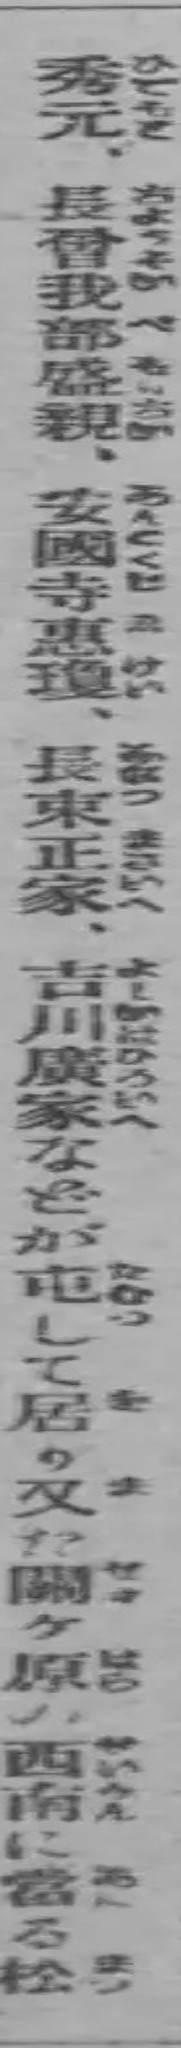秀元、長宗我部盛親、安国寺恵瓊、長束正家、吉川広家などが屯して居り又た関ヶ原の西南に当る松
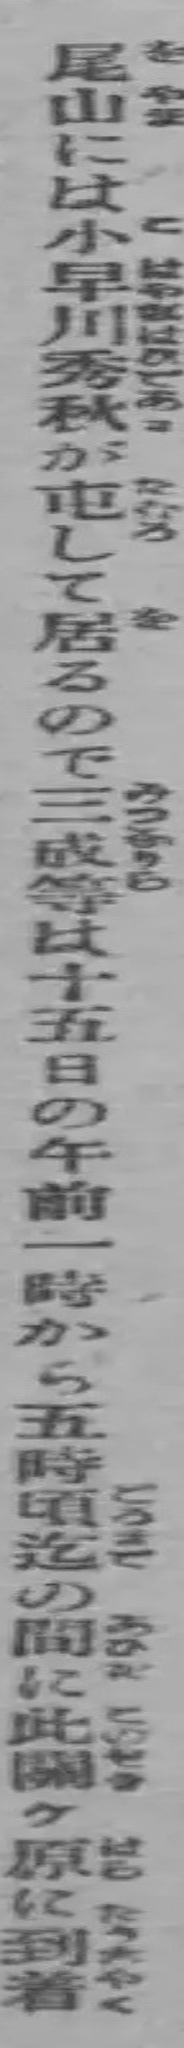尾山には小早川秀秋が屯して居るので三成等は十五日の午前一時から五時頃迄の間に此関ヶ原に到着
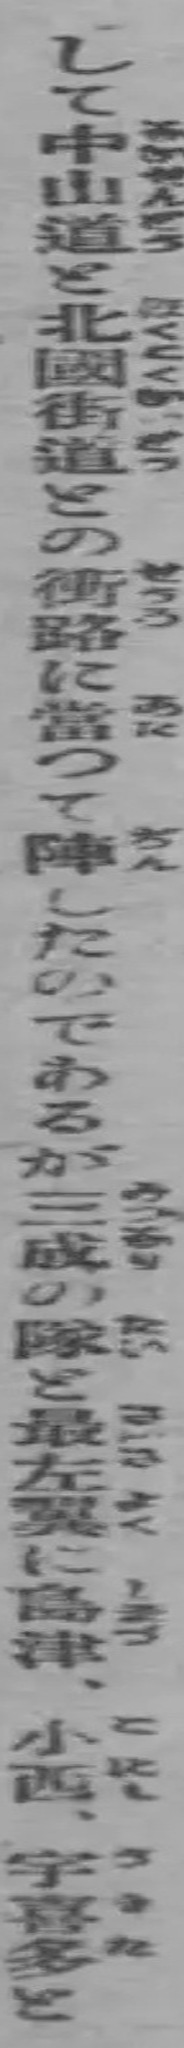して中山道と北国街道との衝路に当つて陣したのであるが三成の隊と最左翼に島津、小西、宇喜多と

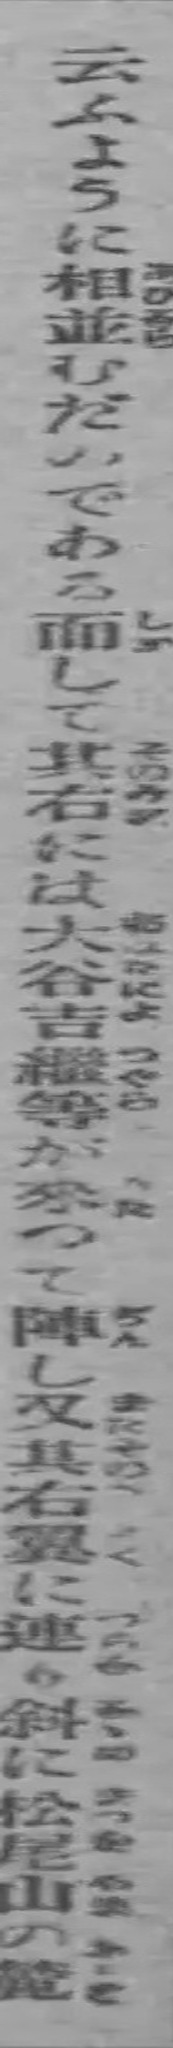云ふように相並むだのである而して其右には大谷吉継等が来つて陣し又其右翼に連り斜に松尾山の麓
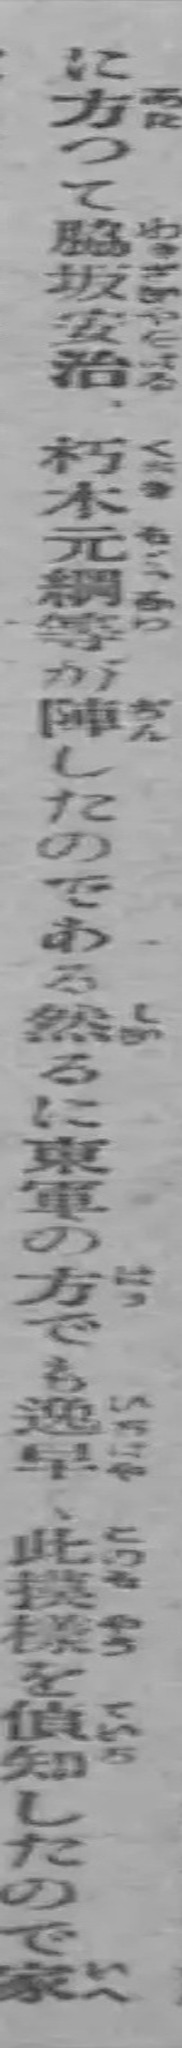に方つて脇坂安治、朽木元網等が陣したのである然るに東軍の方でも逸早く此模様を偵知したので家
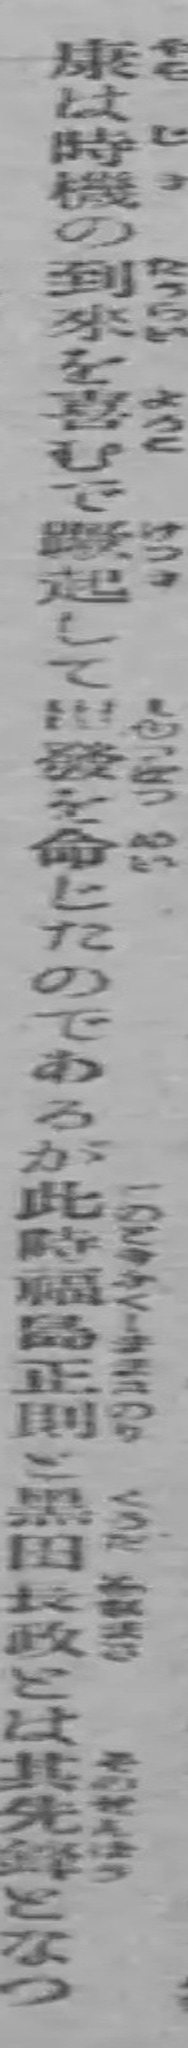康は時機の到来を喜むで蹶起して出発を命じたのであるが此時福島正則と黒田長政とは其先鋒となつ
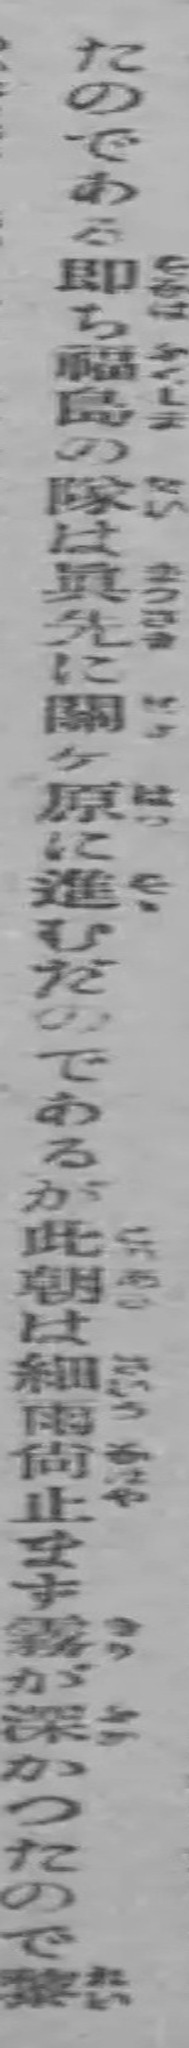東軍の進撃たのである即ち福島の隊は真先に関ヶ原に進むでだのであるが此朝は細雨尚止まず霧が深かつたので黎
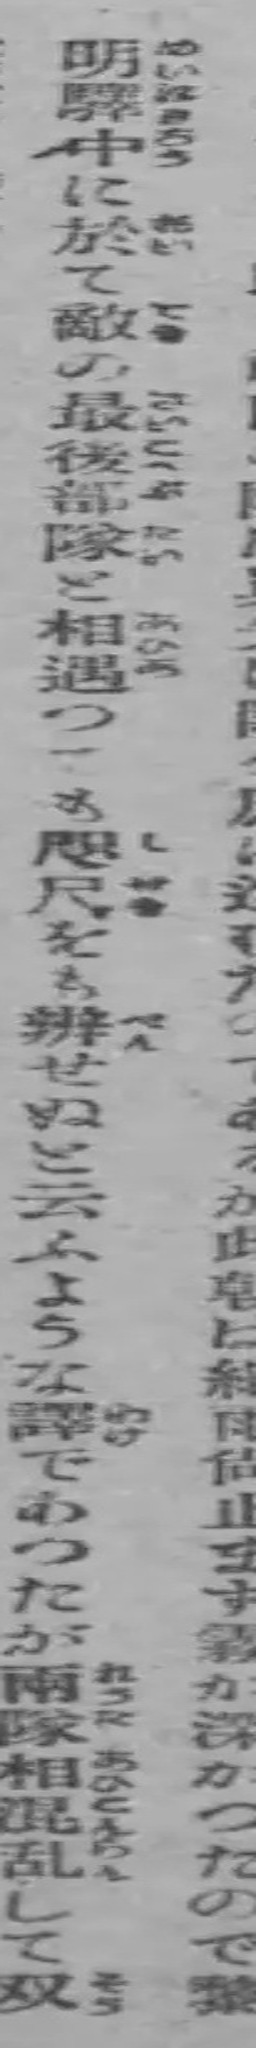明駅中に於て敵の最後部隊と相遇つても咫尺をも弁せぬと云ふような訳であつたが両隊相混乱して双
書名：豊橋市史談
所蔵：国立国会図書館 National Diet Library, JAPAN
